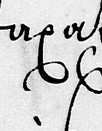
t.
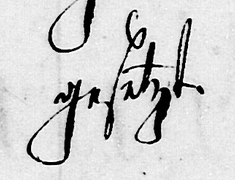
gesetz¬
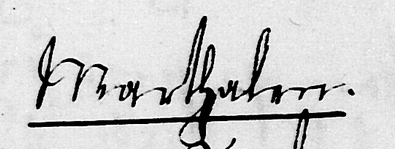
Marthalen.
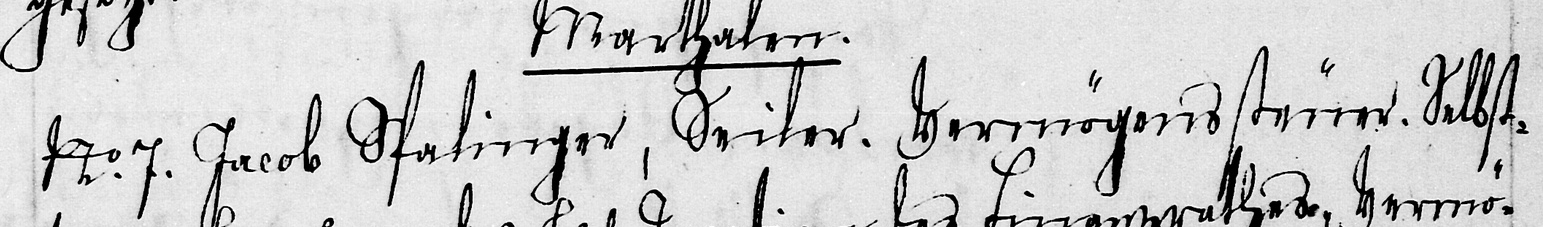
No. 7. Jacob Spalinger, Seiler. Vermögenssteuer. Selbst¬
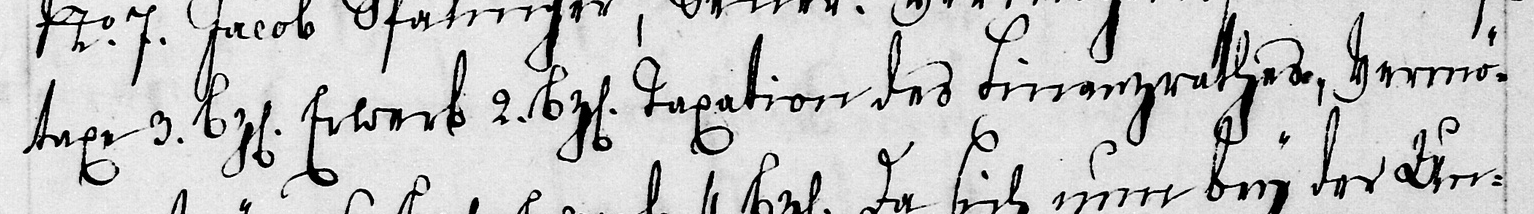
taxe 3. Bz[en]. Erwerb 2. Bz[en]. Taxation des Finanzrathes, Vermö¬
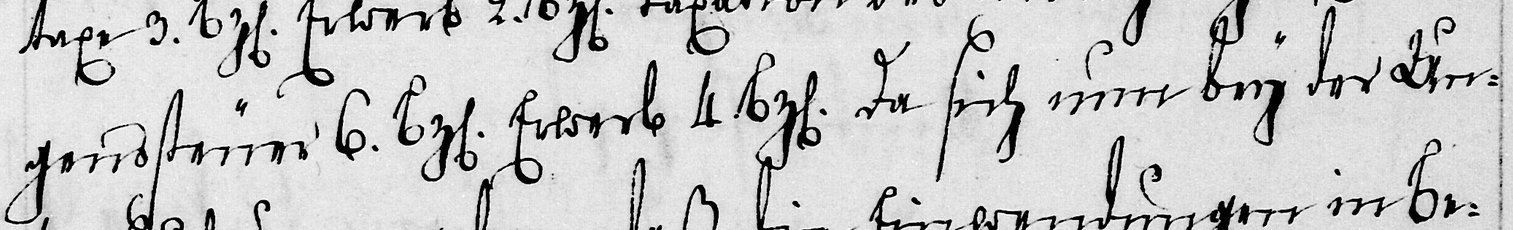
genssteuer 6. Bz[en]. Erwerb 4. Bz[en]. Da sich nun bey der Un¬
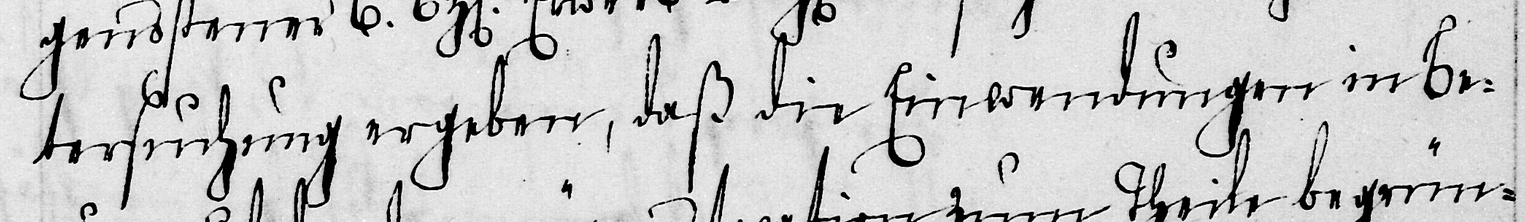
tersuchung ergeben, daß die Einwendungen in Be¬
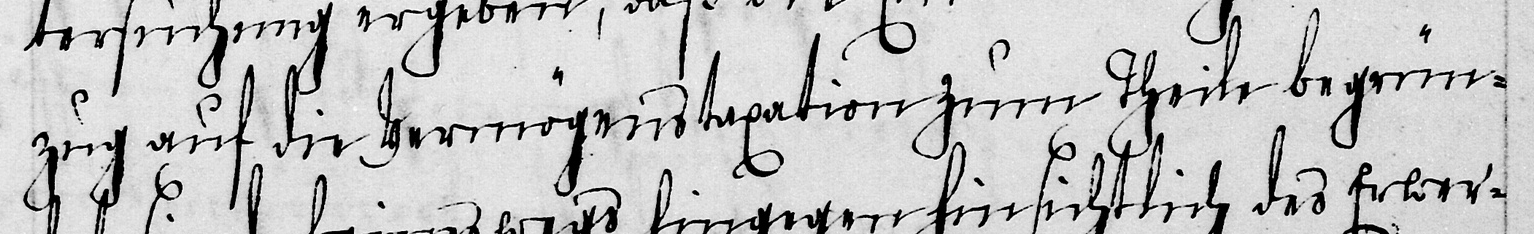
zug auf die Vermögenstaxation zum Theile begrün¬
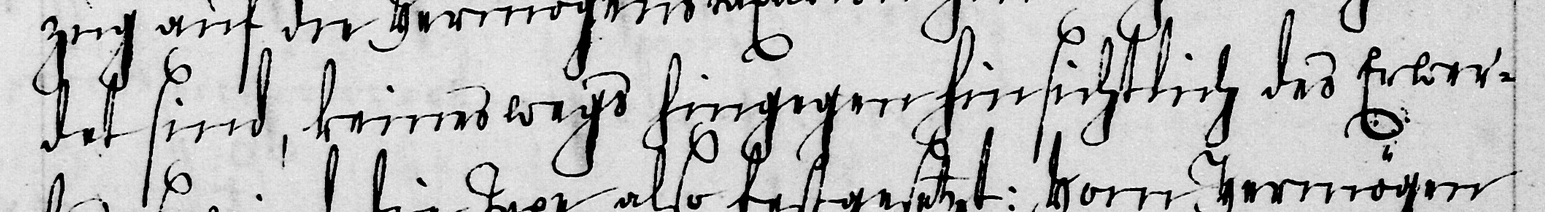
det sind, keineswegs hingegen hinsichtlich des Erwer¬
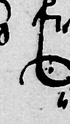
1.
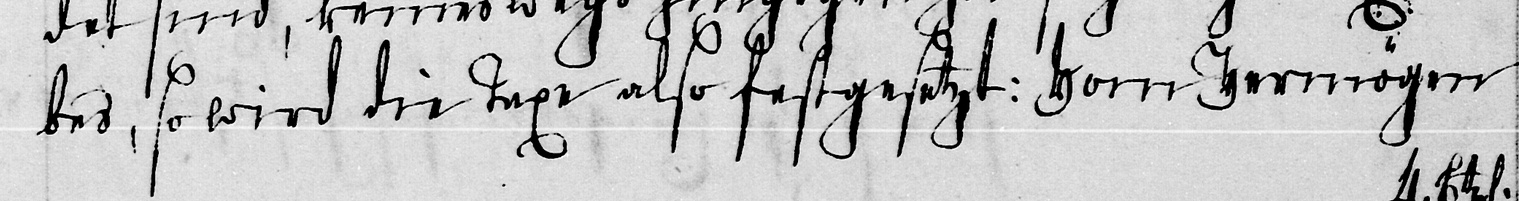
bes, so wird die Taxe also festgesetzt: Vom Vermögen
